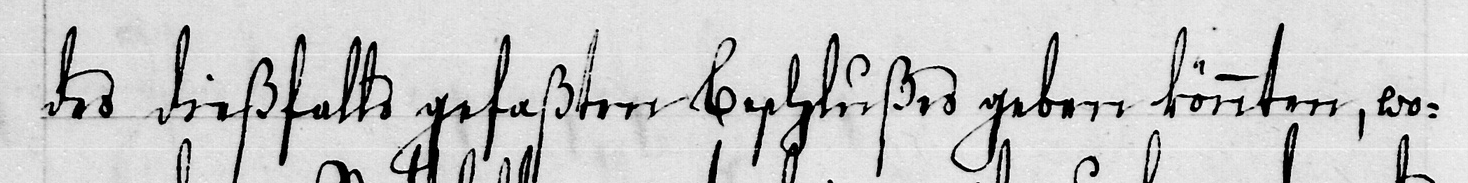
des dießfalls gefaßten Beschlußes geben könnten, wo¬
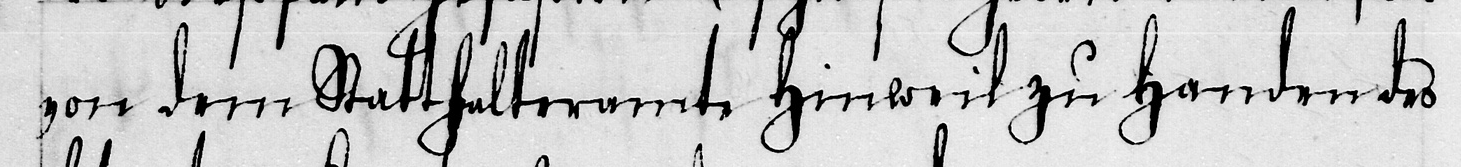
von dem Statthalteramte Hinweil zu Handen des
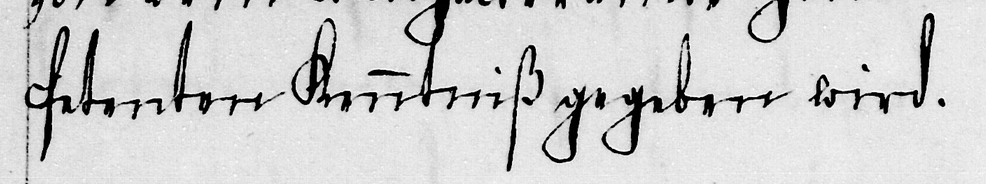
Petenten Kenntniß gegeben wird.
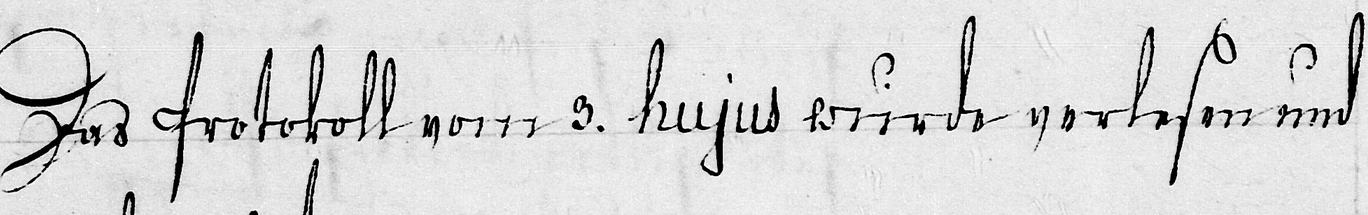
Das Protokoll vom 3. hujus wurde verlesen und
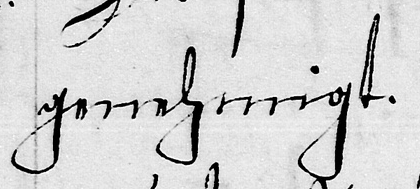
genehmigt.
